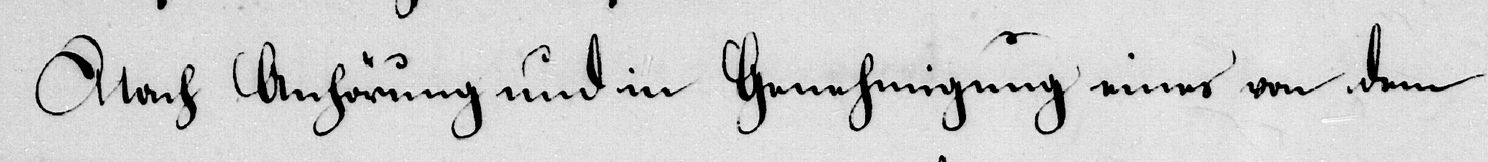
Nach Anhörung und in Genehmigung eines von dem
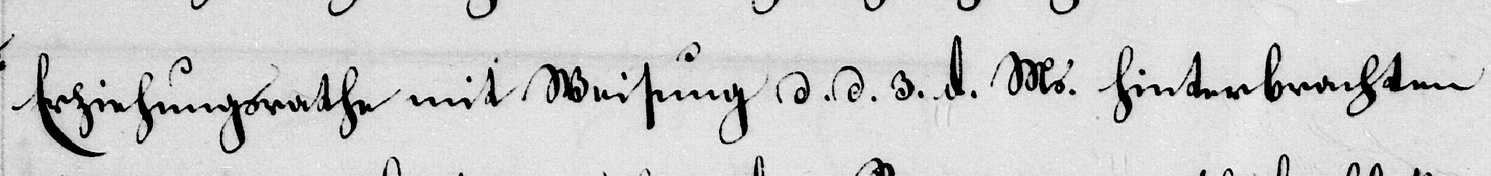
Erziehungsrathe mit Weisung d. d. 3. d. M. hinterbrachten
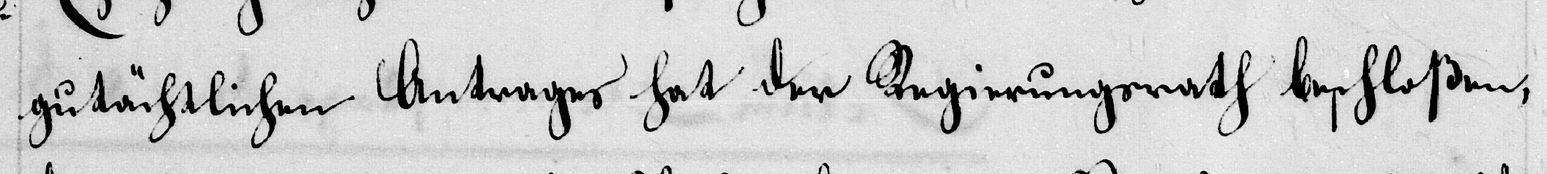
gutächtlichen Antrages hat der Regierungsrath beschloßen,
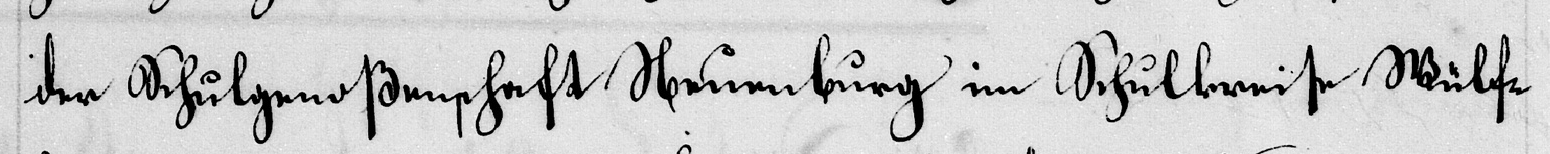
der Schulgenoßenschaft Neuenburg im Schulkreise Wülf¬
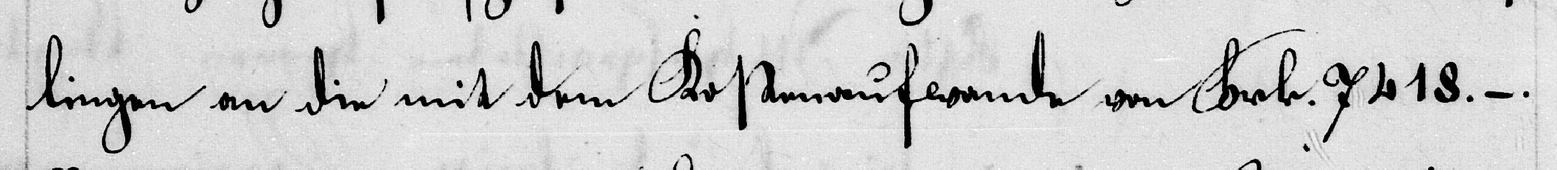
lingen an die mit dem Kostenaufwande von Frk. 7418.–
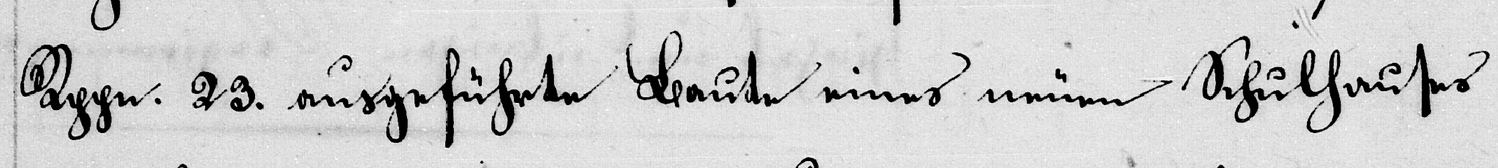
Rppn. 23. ausgeführte Baute eines neuen Schulhauses
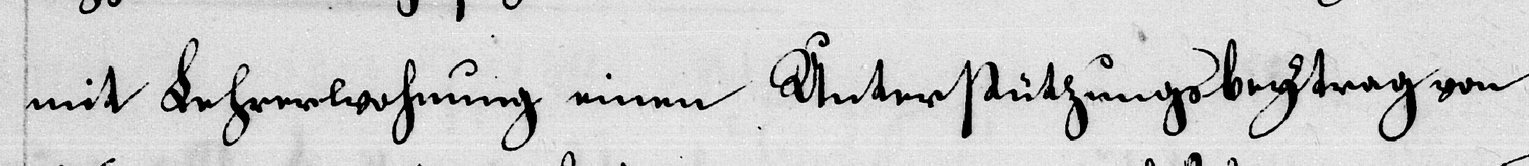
mit Lehrerwohnung einen Unterstützungsbeytrag von
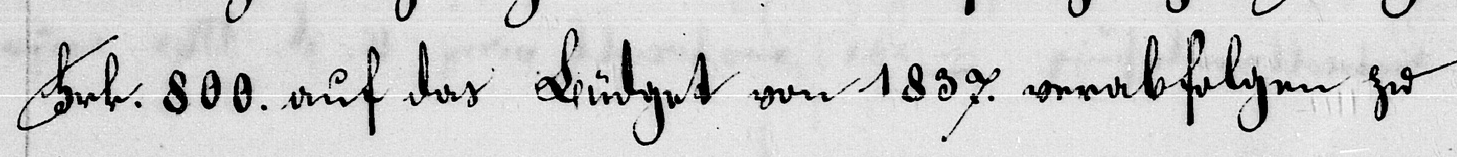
Frk. 800. auf das Budget von 1837. verabfolgen zu
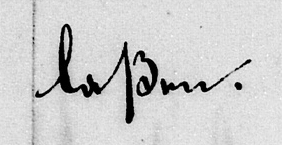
laßen.
